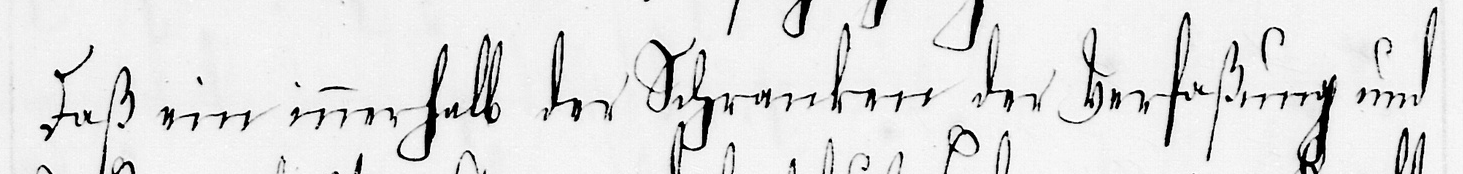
Daß ein innerhalb der Schranken der Verfaßung und
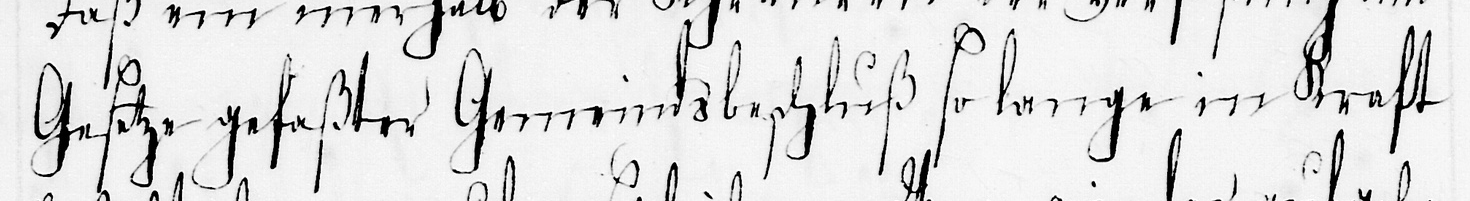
Gesetze gefaßter Gemeindsbeschluß so lange in Kraft
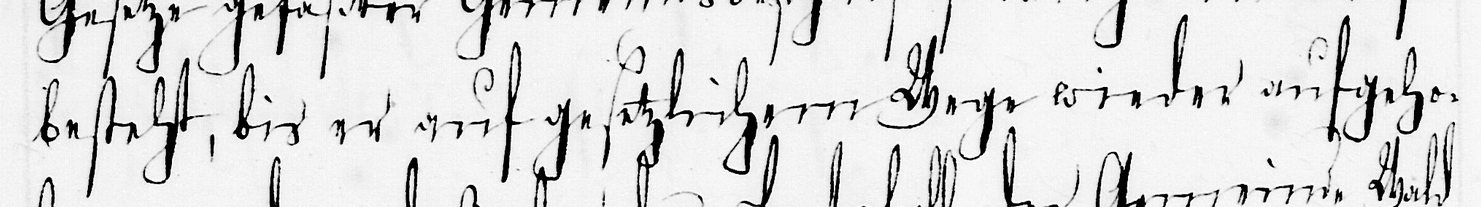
besteht, bis er auf gesetzlichem Wege wieder aufgeho¬
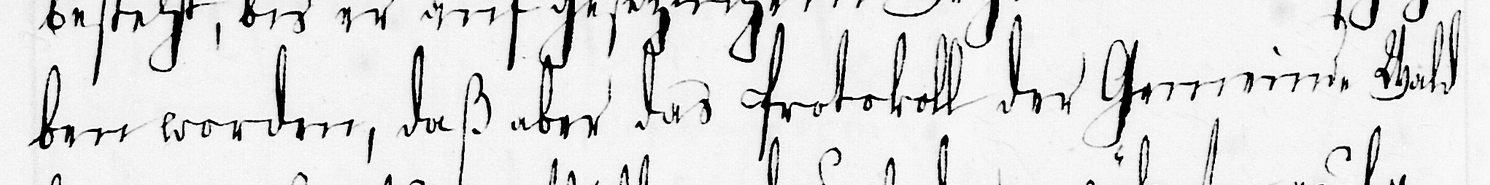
ben worden, daß aber das Protokoll der Gemeinde Wald
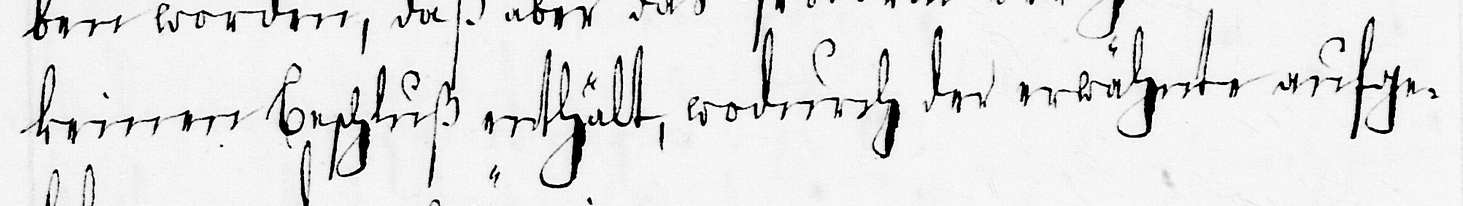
keinen Beschluß enthält, wodurch der erwähnte aufge¬
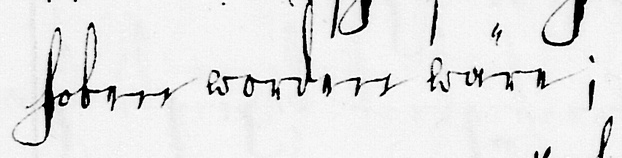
hoben worden wäre;
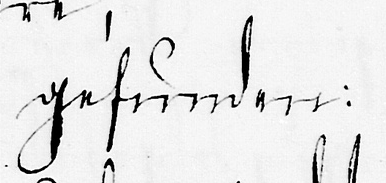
gefunden:
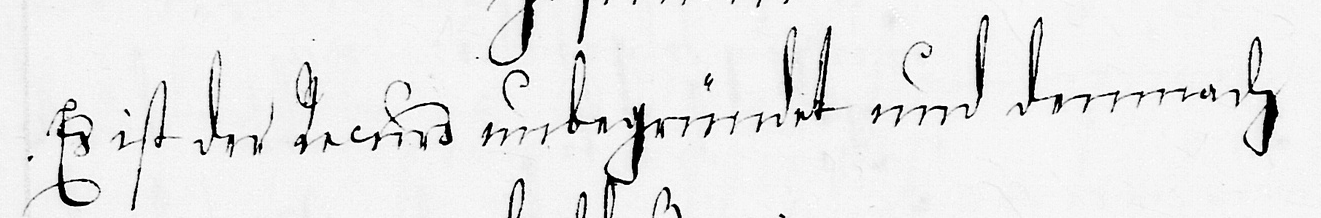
Es ist der Recurs unbegründet und demnach
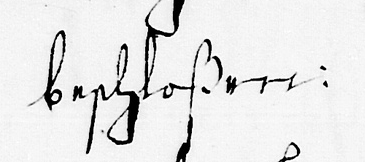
beschloßen:
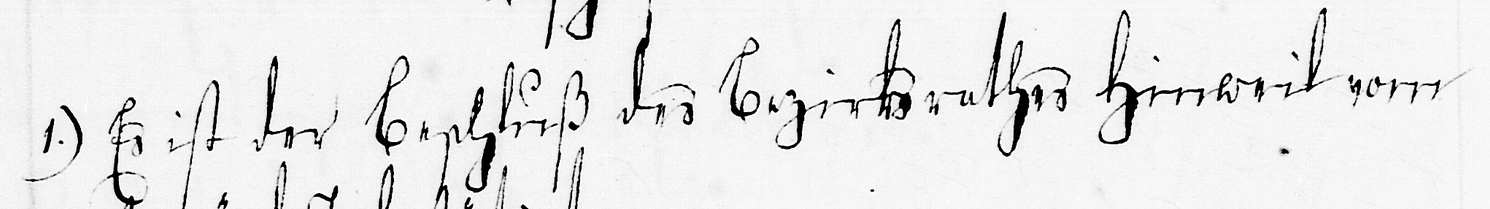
1.) Es ist der Beschluß des Bezirksrathes Hinweil vom
